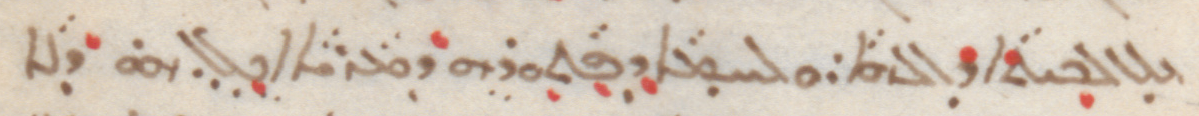ܥ̣ܠ ܠܒܝܬܐ ܕܐܠܗܐ: ܘܠܚܡܐ ܕܦܬܘܪܗ ܕܡܪܝܐ ܐܟ̣ܠ. ܗ̇ܘ ܕܠܐ
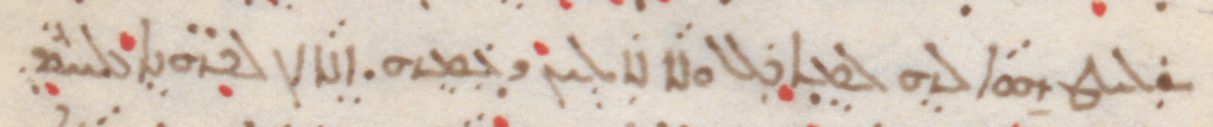ܫܠܝܛ ܗܘܐ ܠܗ ܠܡܐܟܠ ܘܠܐ ܠܐܝܠܝܢ ܕܥܡܗ. ܐܠܐ ܐܢ ܠܟ̈ܗܢܐ ܒܠܚܘܕ
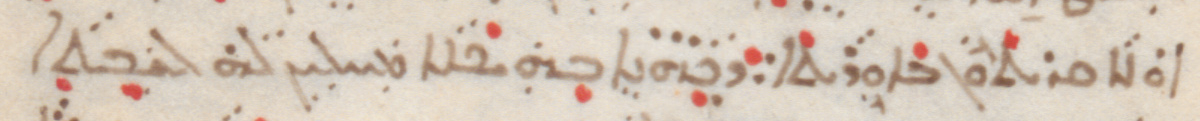ܐܘ ܠܐ ܩܪܝܬܘܢ ܒܐܘܪܝܬܐ܇ ܕܟܗ̈ܢܐ ܒܗܝܟܠܐ ܡܚܠܝܢ ܠܗ̇ ܠܫܒܬܐ
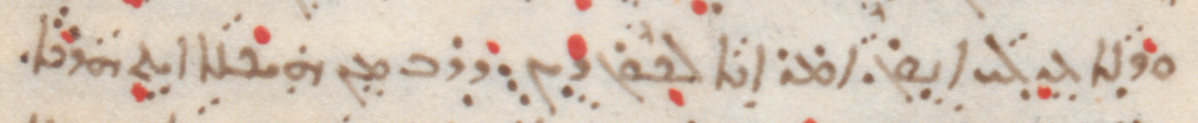ܘܕܠܐ ܥܕܠܝ ܐܢܘܢ. ܐܡ̇ܪ ܐܢܐ ܠܟܘܢ ܕܝܢ܆ ܕܪܒ ܡ̣ܢ ܗܝܟܠܐ ܐܝܬ ܗܪܟܐ.
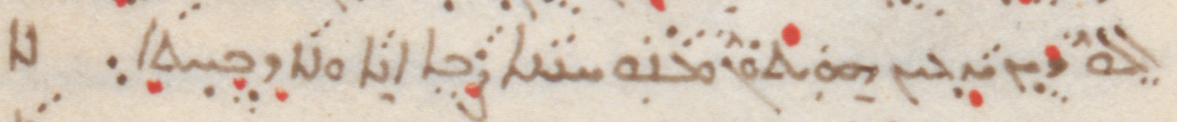ܐܠܘ ܕܝܢ ܝ̇ܕܥܝܢ ܗܘܝܬܘܢ ܡܢܘ ܚܢܢܐ ܨ̇ܒܐ ܐܢܐ ܘܠܐ ܕܒܚܬܐ܆ ܠܐ
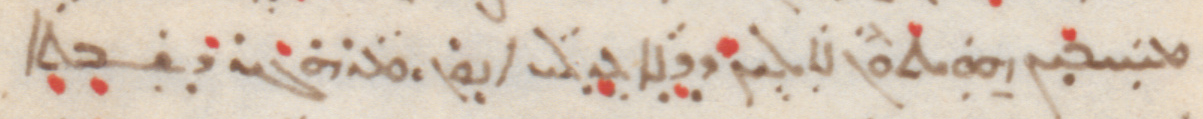ܡܚܝܒܝܢ ܗܘܝܬܘܢ ܠܐܝܠܝܢ ܕܕܠܐ ܥܕܠܝ ܐܢܘܢ. ܡܪܗܓܝܪ ܕܫܒܬܐ
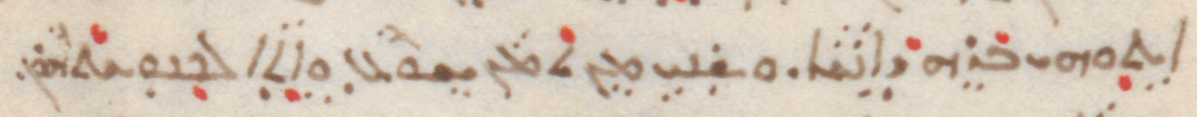ܐܝܬܘܗܝ ܒܪܗ ܕܐܢܫܐ. ܘܫܢܝ ܡ̣ܢ ܬܡܢ ܝܫܘܥ ܘܐܬ̣ܐ ܠܟܢܘܫܬܗܘܢ
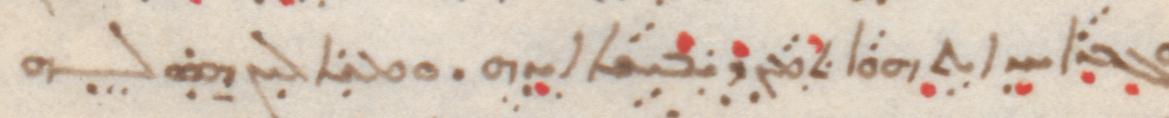ܘܓܒܪܐ ܚܕ ܐܝܬ ܗܘܐ ܬܡܢ ܕܝܒܝܫܐ ܐܝܕܗ. ܘܡܫܐܠܝܢ ܗܘܘ ܠܗ
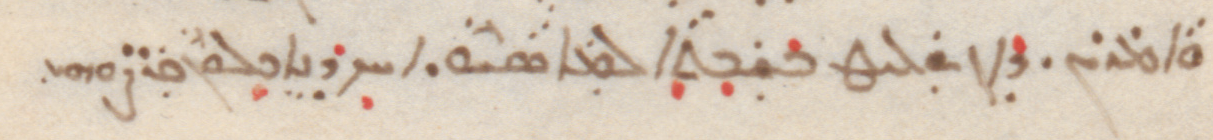ܘܐܡ̇ܪܝܢ. ܕܐܢ ܫܠܝܛ ܒܫܒܬܐ ܠܡܐܣܝܘ. ܐܝܟ ܕܢܐܟܠܘܢ ܩܪ̈ܨܘܗܝ
